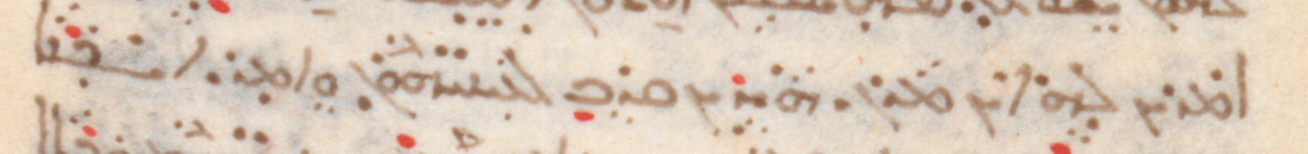ܐܡܪܝܢ ܠܗ̇ ܐܝܢ ܡܪܢ. ܗ̇ܝܕܝܢ ܩܪܒ ܠܥܝܢܝ̈ܗܘܢ ܘܐܡ̣ܪ. ܐܝܟܢܐ
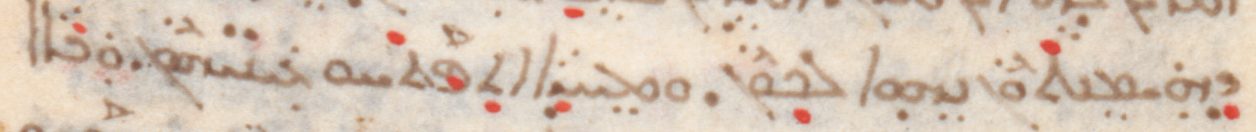ܕܗܝܡܢܬܘܢ ܢܗܘܐ ܠܟܘܢ. ܘܡܚܕܐ ܐܬܦܬܚܘ ܥܝܢܝ̈ܗܘܢ. ܘܟܐܐ
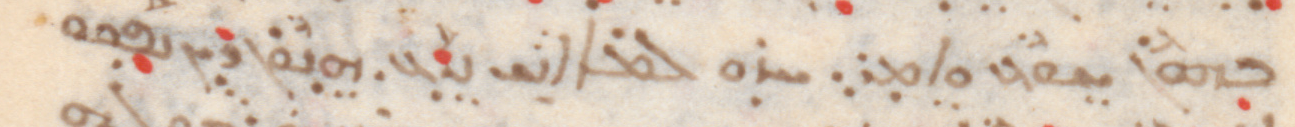ܒܗܘܢ ܚܘܥ ܘܐܡ̣ܪ܆ ܚܙܘ ܠܡܐ ܐܢܫ ܢܕܥ. ܗܢܘܢ ܕܝܢ ܢܦ̣ܩܘ
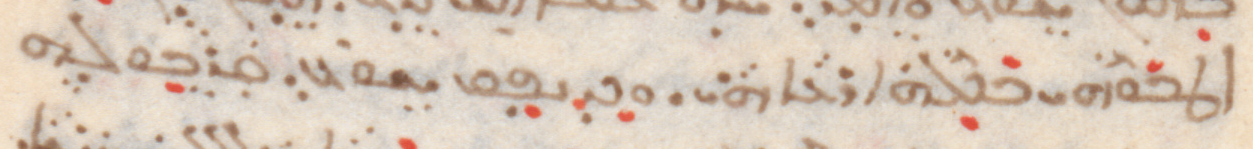ܐܛܒܘܗܝ ܒܟܠܗ̇ ܐܪܥܐ ܗ̇ܝ. ܘܟܕ ܢܦ̣ܩ ܝܫܘܥ: ܩܪܒܘ ܠܗ
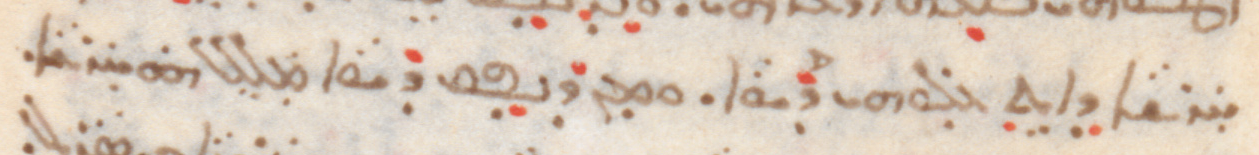ܚܪܫܐ ܕܐܬ ܥܠܘܗܝ ܕܝܘܐ. ܘܡ̣ܢ ܕܢܦ̣ܩ ܕܝܘܐ ܡܠܠܐ ܗ̇ܘ ܚܪܫܐ.
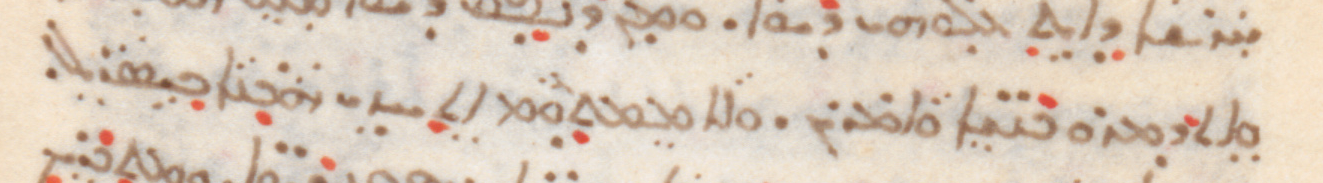ܘܐܬܕܡܪܘ ܟܢ̈ܫܐ ܘܐܡ̇ܪܝܢ. ܘܠܐ ܡܡܬܘܡ ܐܬܚܙܝ ܗܟܢܐ ܒܝܣܪܝܠ.
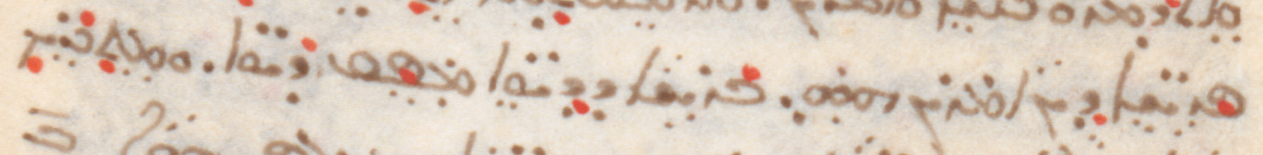ܦܪ̈ܝܫܐ ܕܝܢ ܐܡ̇ܪܝܢ ܗܘܘ: ܒܪܝܫܐ ܕܕܝ̈ܘܐ ܡܦܩ ܕܝ̈ܘܐ. ܘܡܬܟܪܟ
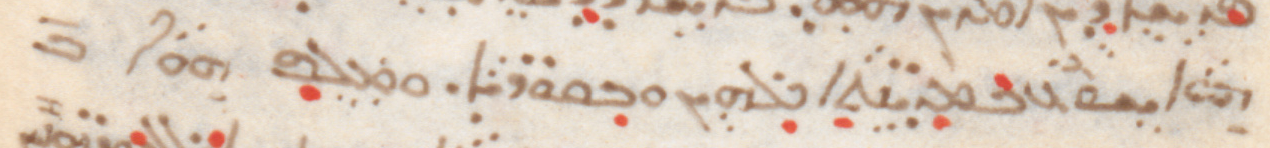ܗܘ̇ܐ ܝܫܘܥ ܒܡܕܝܢ̈ܬܐ ܟܠܗܝܢ ܘܒܩܘܪ̈ܝܐ. ܘܡܠܦ ܗܘܐ ܏ܒ
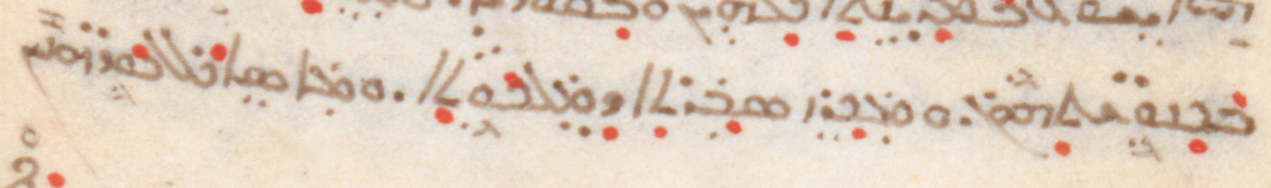ܒܟܢܘ̈ܫܬܗܘܢ. ܘܡܟܪܐ ܣܒܪܬܐ ܕܡܠܟܘܬܐ. ܘܡܐܣܐ ܟܠ ܟܘܪ̈ܗܢܝܢ
